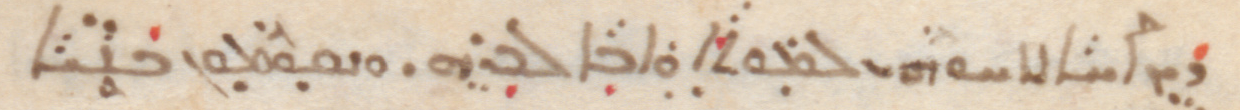ܕܝܢ ܐܚܐ ܠܐܚܘܗܝ ܠܡܘܬܐ ܘܐܒܐ ܠܒܪܗ. ܘܢܩܘܡܘܢ ܒܢܝ̈ܐ
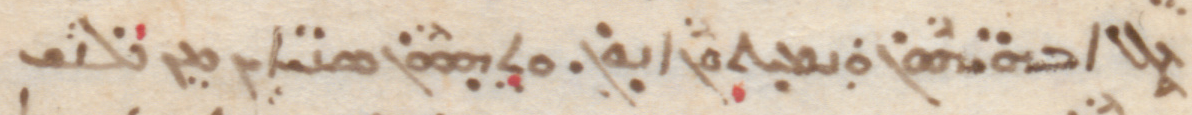ܥܠ ܐܒܗ̈ܝܗܘܢ ܘܢܡܝܬܘܢ ܐܢܘܢ. ܘܬܗܘܘܢ ܣܢ̈ܝܐܝܢ ܡ̣ܢ ܟܠܢܫ
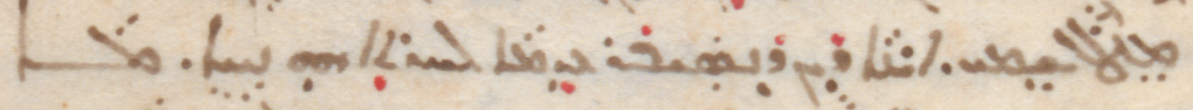ܡܛܠ ܫܡܝ. ܐܝܢܐ ܕܝܢ ܕܢܣܝܒܪ ܥܕܡܐ ܠܚܪܬܐ ܗ̣ܘ ܢܚܐ. ܡܐ
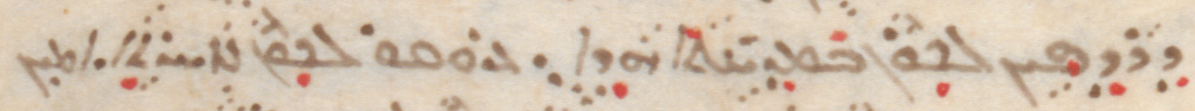ܕܪܕܦܝܢ ܠܟܘܢ ܒܡܕܝܢܬܐ ܗܕܐ܆ ܥܪܘܩܘ ܠܟܘܢ ܠܐܚܪܬܐ. ܐܡ̣ܝܢ
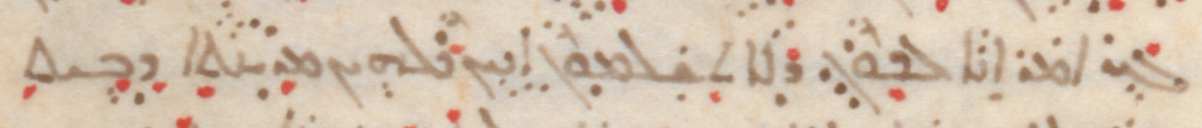ܓܝܪ ܐܡ̇ܪ ܐܢܐ ܠܟܘܢ܆ ܕܠܐ ܬܫܠܡܘܢ ܐܢܝܢ ܟܠܗܝܢ ܡܕܝܢ̈ܬܐ ܕܒܝܬ
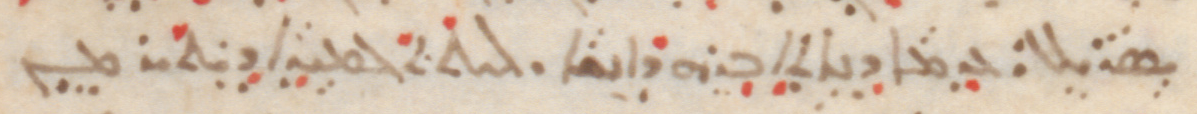ܝܣܪܝܠ: ܥܕܡܐ ܕܢ̣ܐܬܐ ܒܪܗ ܕܐܢܫܐ. ܠܝܬ ܬܠܡܝܕܐ ܕܝܬܝܪ ܡ̣ܢ
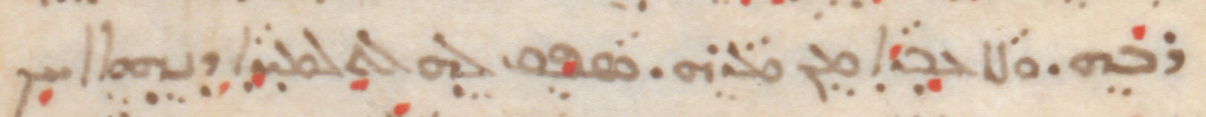ܪܒܗ. ܘܠܐ ܥܒ̣ܕܐ ܡ̣ܢ ܡܪܗ. ܣܦܩ ܠܗ ܠܬܠܡܝܕܐ ܕܢܗܘܐ ܐܝܟ
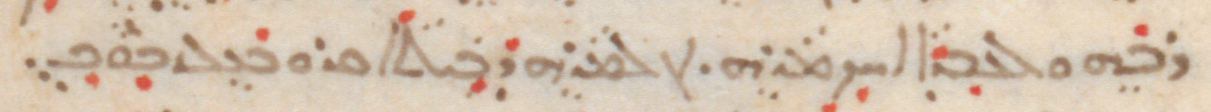ܪܒܗ ܘܠܥܒ̣ܕܐ ܐܝܟ ܡܪܗ. ܐܢ ܠܡܪܗ ܕܒܝܬܐ ܩܪܘ ܒܥܠܙܒܘܒ܆
